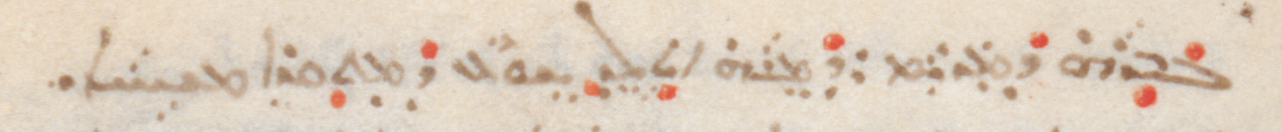ܓܒܪܗ ܕܡܪܝܡ: ܕܡܢܗ̇ ܐܬܝܠܕ ܝܫܘܥ ܕܡܬܩܪܐ ܡܫܝܚܐ.
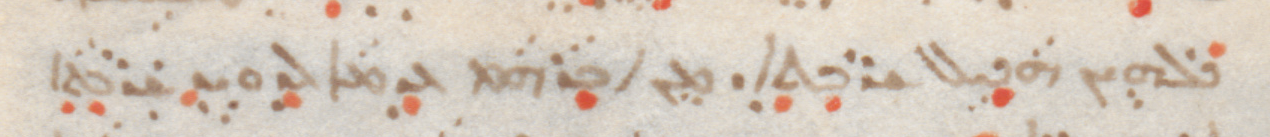ܟܠܗܝܢ ܗܟܝܠ ܫܪ̈ܒܬܐ. ܡ̣ܢ ܐܒܪܗܡ ܥܕܡܐ ܠܕܘܝܕ ܫܪ̈ܒܬܐ
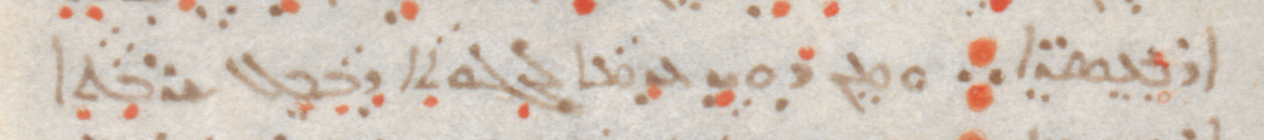ܐܪܒܥܣܪ̈ܐ܀ ܘܡ̣ܢ ܕܘܝܕ ܥܕܡܐ ܠܓܠܘܬܐ ܕܒܒܠ ܫܪ̈ܒܬܐ
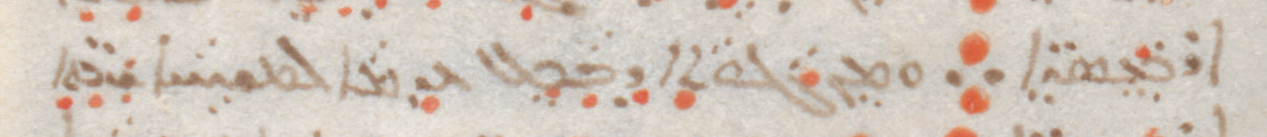ܐܪܒܥܣܪ̈ܐ܀ ܘܡ̣ܢ ܓܠܘܬܐ ܕܒܒܠ ܥܕܡܐ ܠܡܫܝܚܐ ܫܪ̈ܒܬܐ
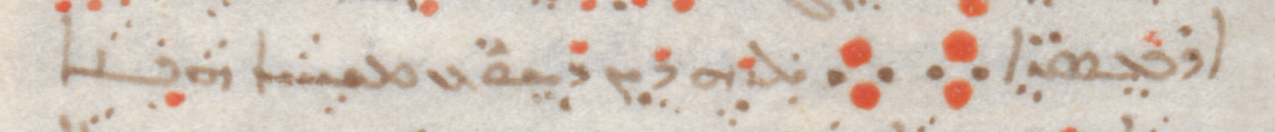ܐܪܒܥܣܪ̈ܐ܀܀ ܝܠܕܗ ܕܝܢ ܕܝܫܘܥ ܡܫܝܚܐ ܗܟܢܐ
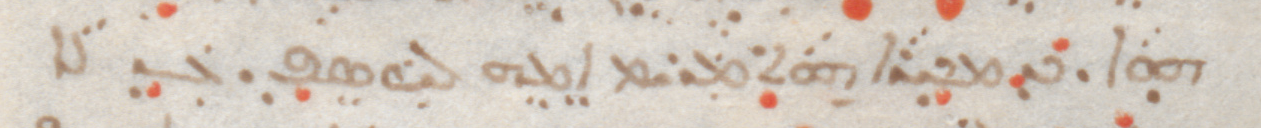ܗܘ̣ܐ. ܟܕ ܡܟܝܪܐ ܗܘܬ݀ ܡܪܝܡ ܐܡܗ ܠܝܘܣܦ. ܥܕ ܠܐ
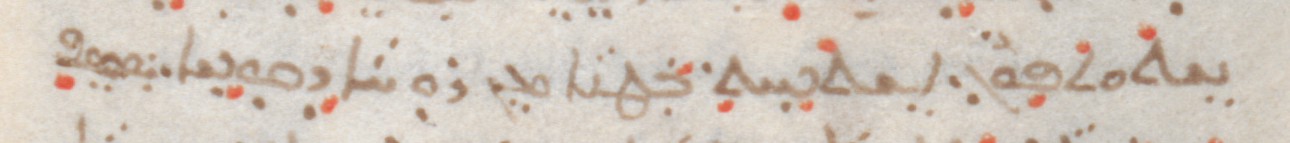ܢܫܬܘܬܦ݂ܘܢ܆ ܐܫܬܟܚܬ݀ ܒܛܢܐ ܡ̣ܢ ܪܘܚܐ ܕܩܘܕܫܐ. ܝܘܣܦ
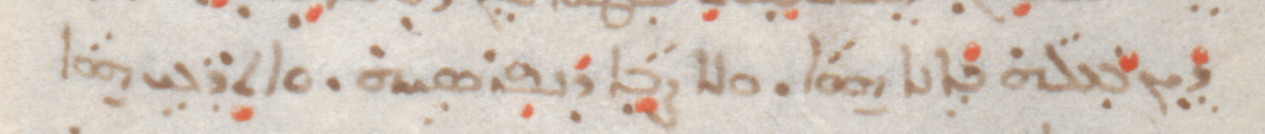ܕܝܢ ܒܥܠܗ̇ ܟܐܢܐ ܗܘܐ. ܘܠܐ ܨܒܐ ܕܢܦܪܣܝܗ̇. ܘܐܬܪܥܝ ܗܘܐ
